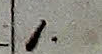1.
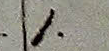1.
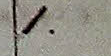1.
